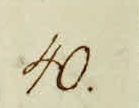40.
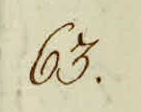63.
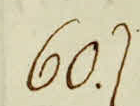60.
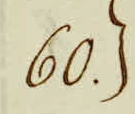60.
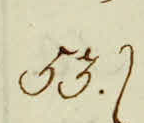53.
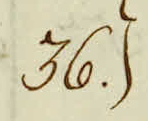36.
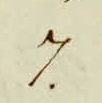7.
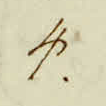4.
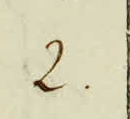2.
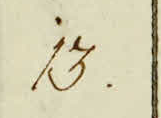13.
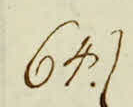64.
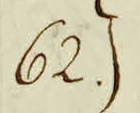62.
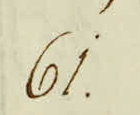61.
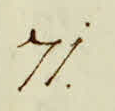71.
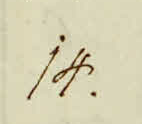14.
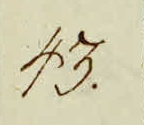43.
